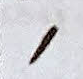1
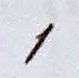1
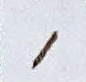1
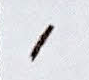1
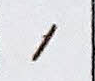1
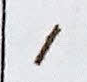1
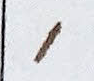1
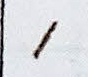1
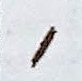1
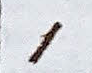1
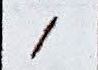1
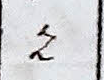2
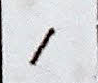1
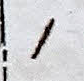1
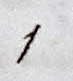1
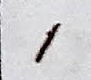1
